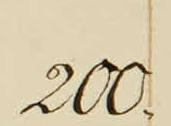200
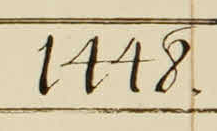1448
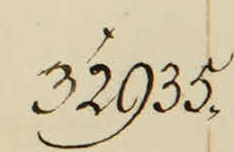32935
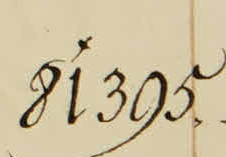81395
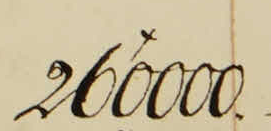260000.
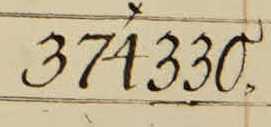374330
